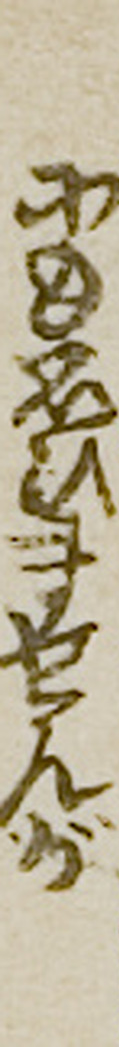にも思ひませんが
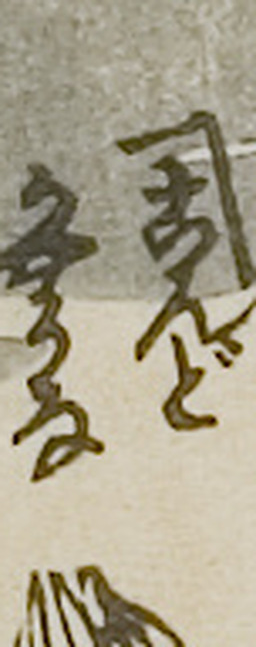かやうな
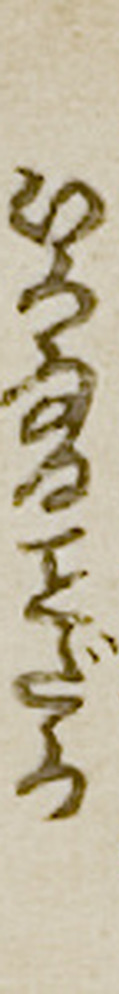いかなることだか
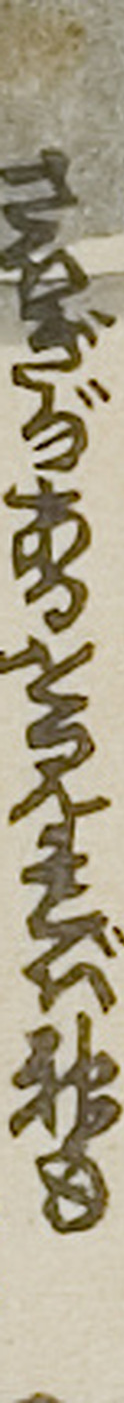さはぎがあるを見れば神も
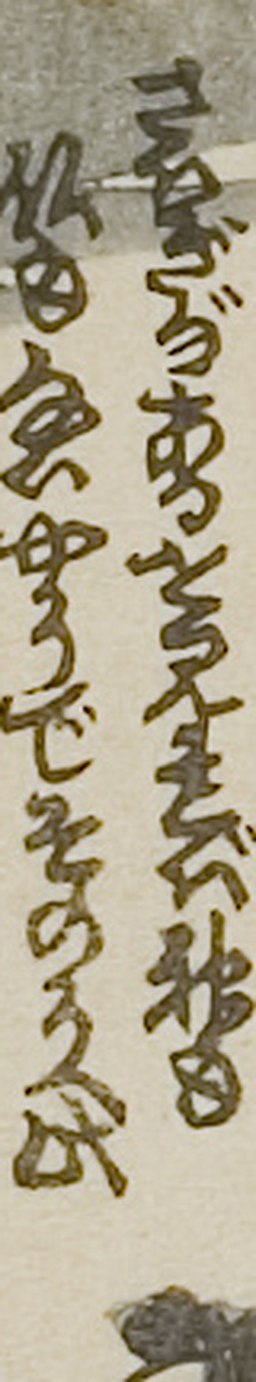仏もないやうでそのうへ此
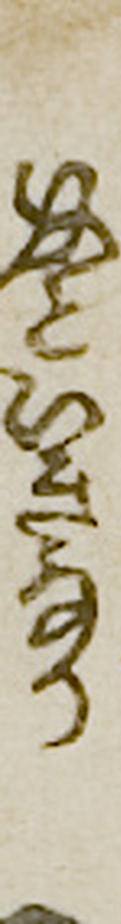いふといきなり
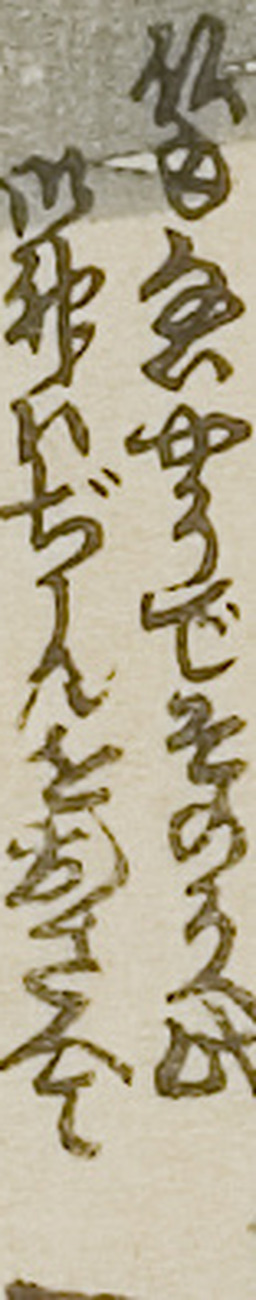御神はぢしんをおさへて
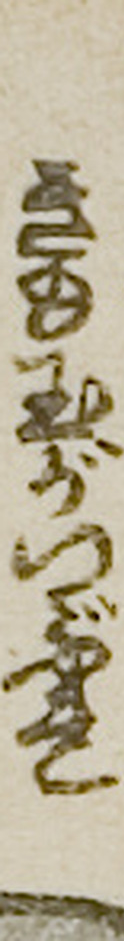きも玉がつぶれ
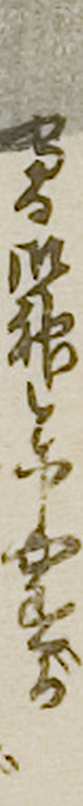守る御神と申しやすが
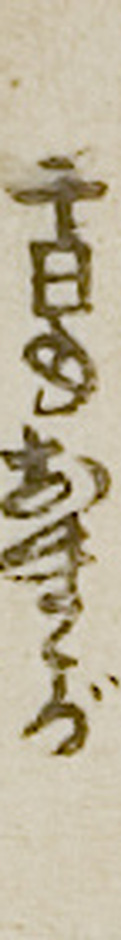十日もおまゝが
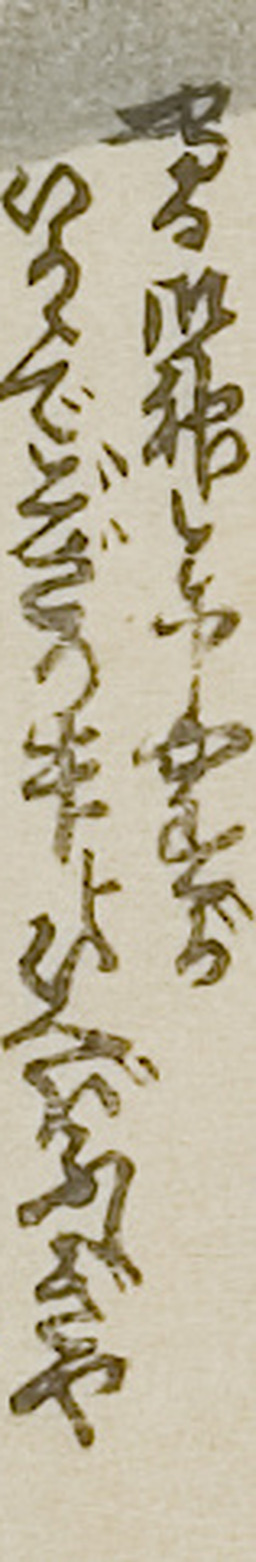いかゝでござり升といへばふしぎや
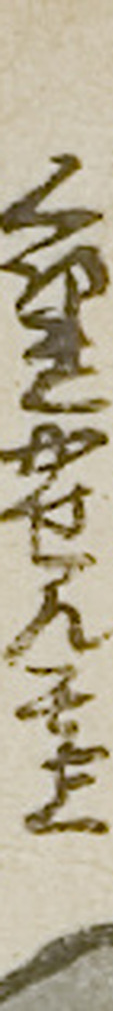くはれやせん其上
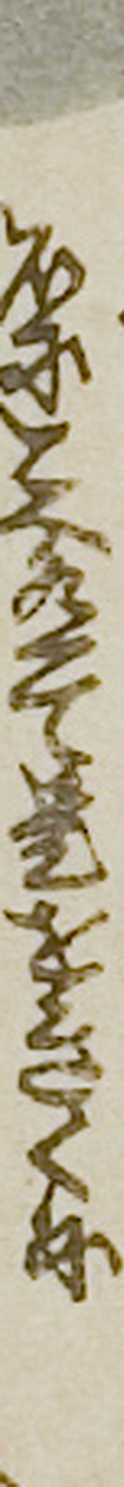石にこへ有て是をきくに
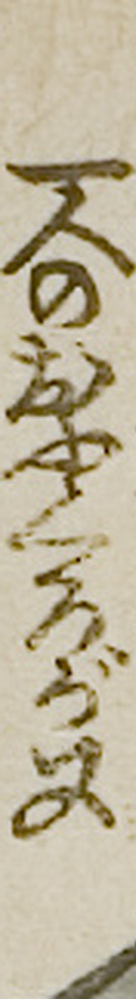一人のおふくろが又
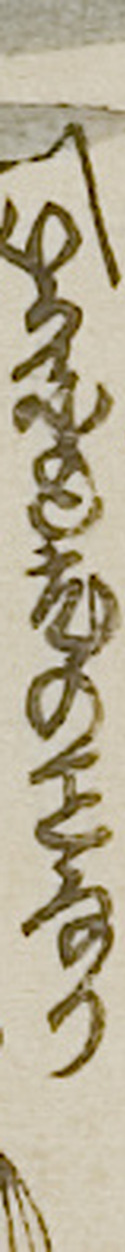〽いかにも尤のことなり
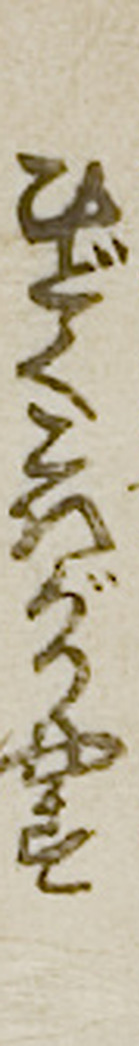ひどくこはがりやす
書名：あんしん要石
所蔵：東京大学総合図書館 General Library in the University of Tokyo, JAPAN
